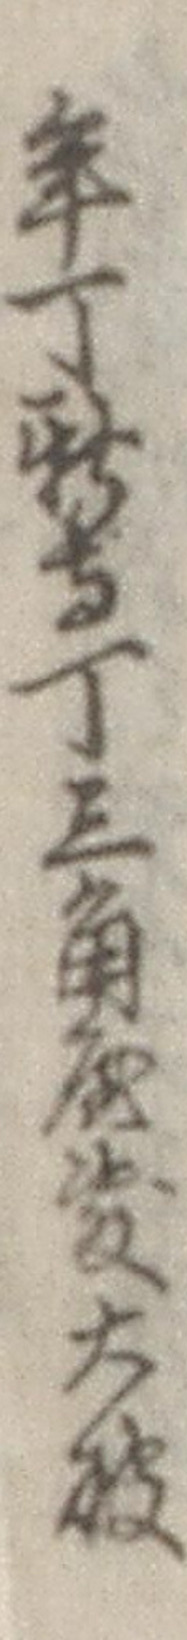年丁軒寺丁三角屋敷大破
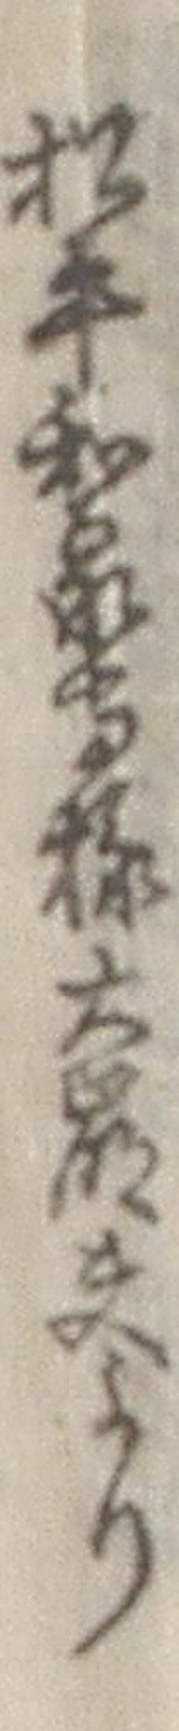松平和泉守様大崩夫より
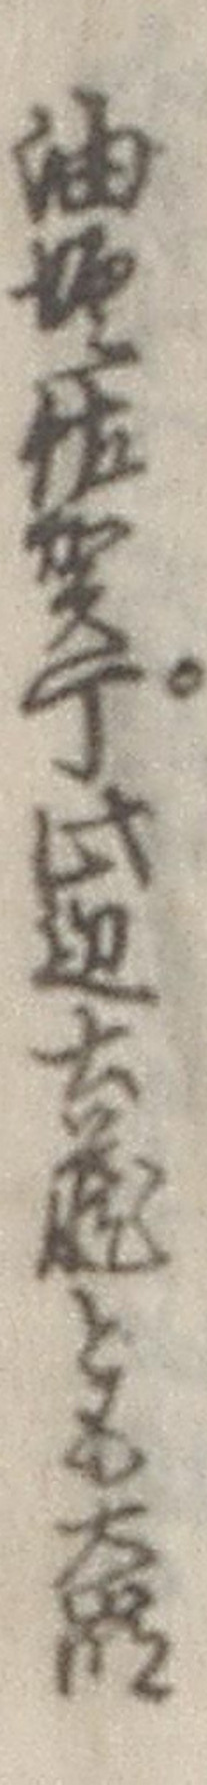油煙佐賀丁此辺土蔵とも大崩
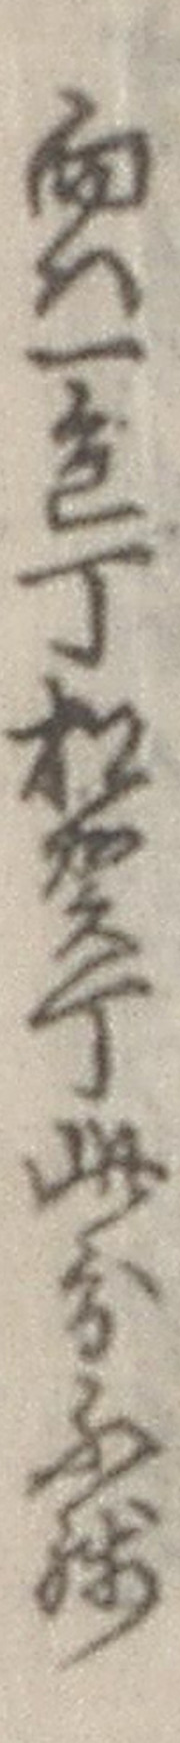向ハ一色丁松賀丁此分不残
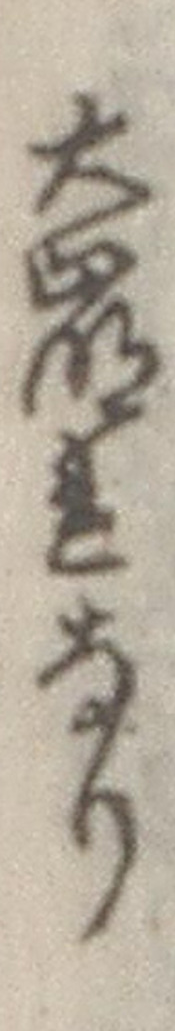大崩れなり
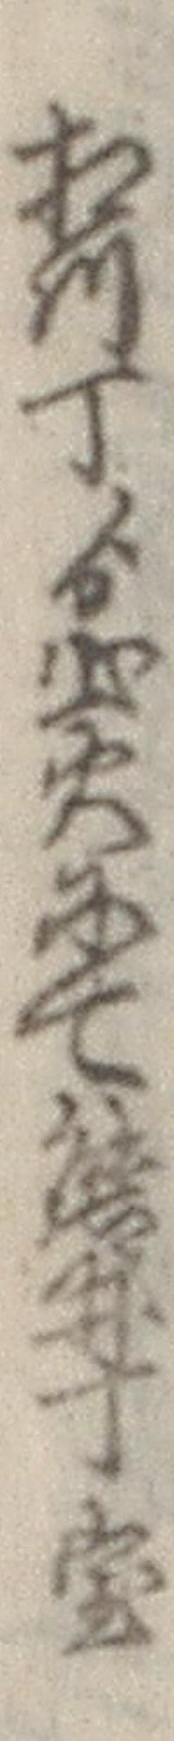松川丁ゟ出火にて熊井丁宝
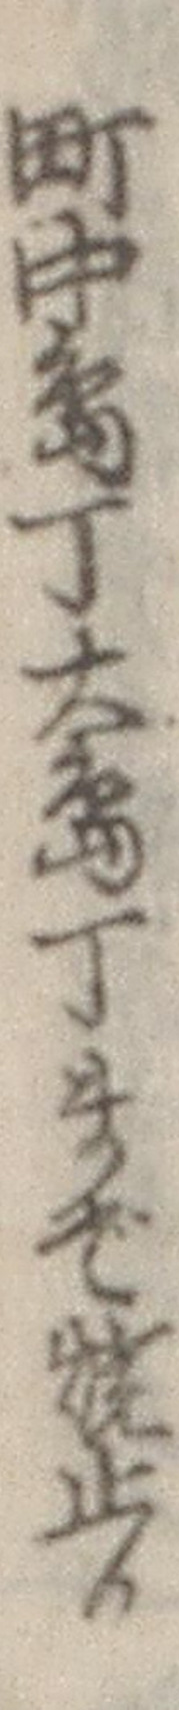町中島丁大島丁まで焼止る
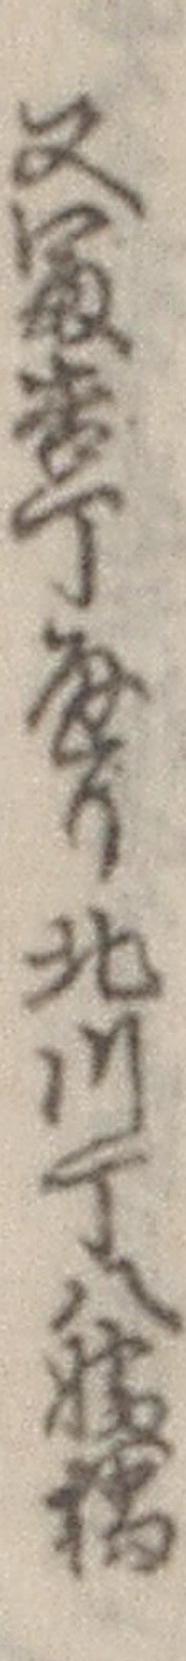又富吉丁通り北川丁八幡橋
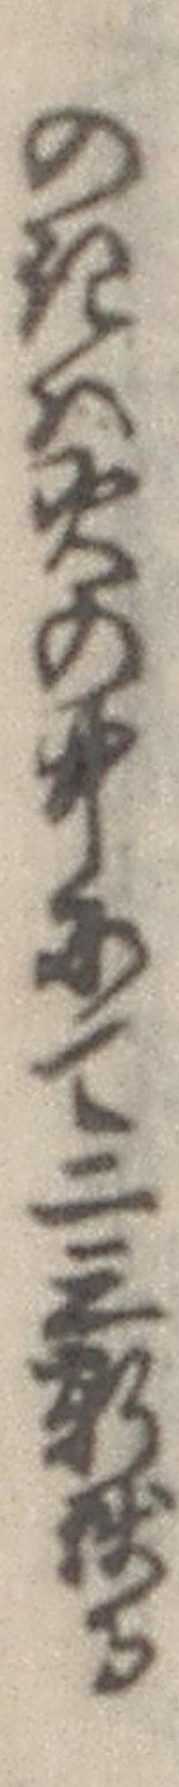のきハ火の中にて二三軒残る
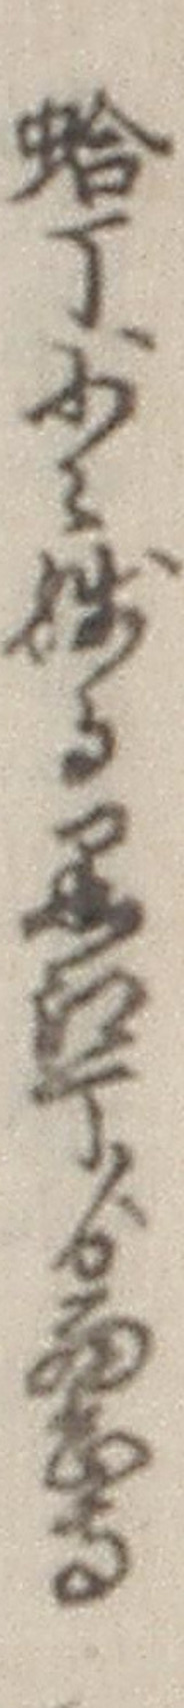蛤丁少〻残る黒江丁ゟ西念寺
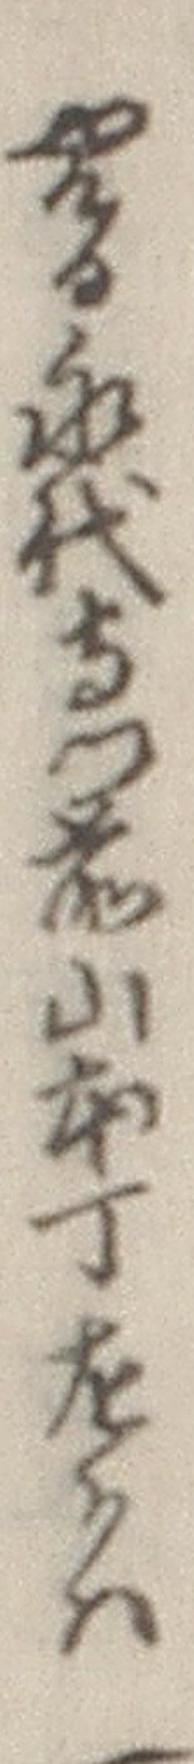やける永代寺門前山本丁左りハ
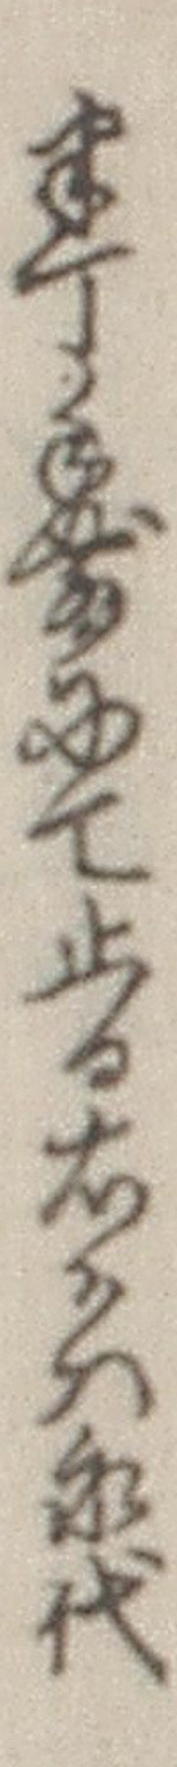半丁手前にて止る右かハ永代
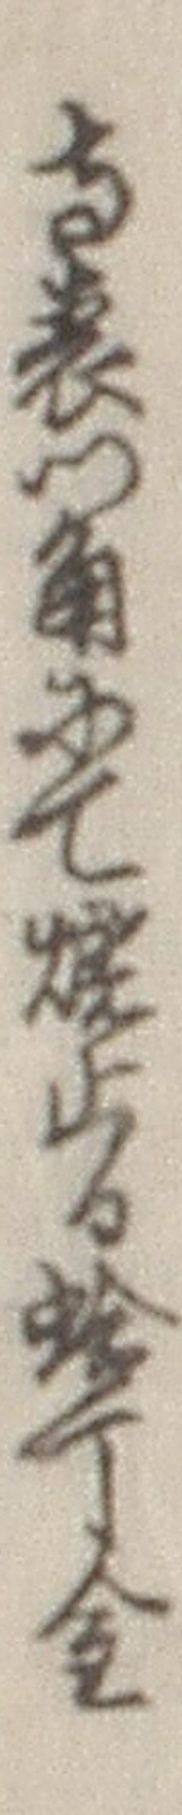寺表門角にて焼止る蛤丁金
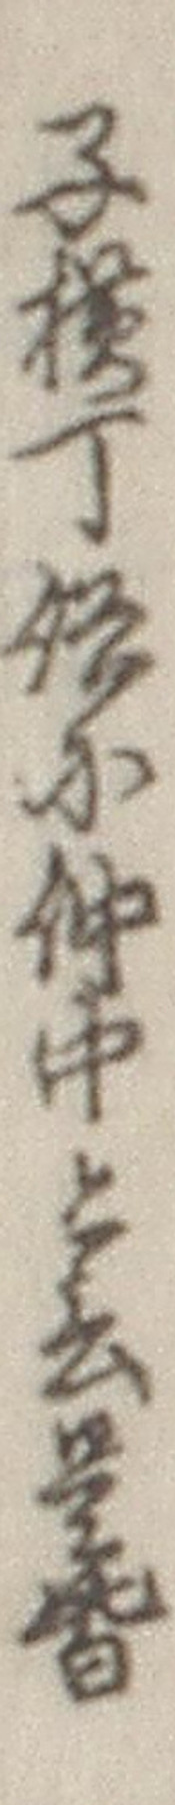子横丁傳に仲中と云是皆
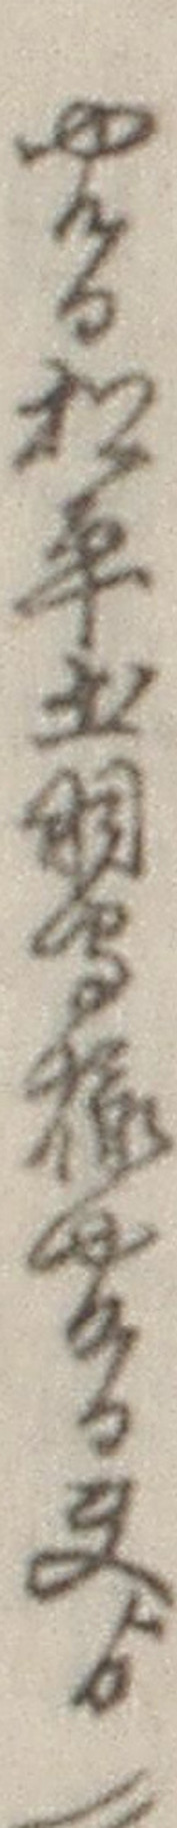やける松平出羽守様やける夫ゟ
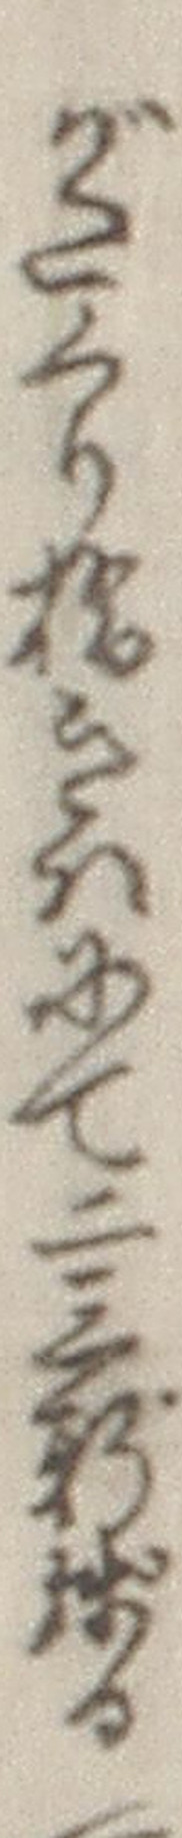がたくり橋きハにて二三軒残る
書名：江戸　大地震臣細録　全
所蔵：東京大学地震研究所図書室 Earthquake Research Institute Library, The University of Tokyo, JAPAN
